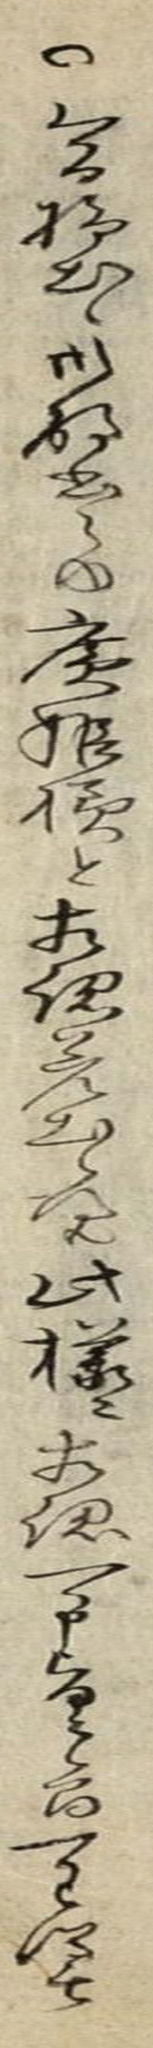○今日指出候御触書之内広姫様と相認差出候得共此様に相認可申旨に候間可被得其
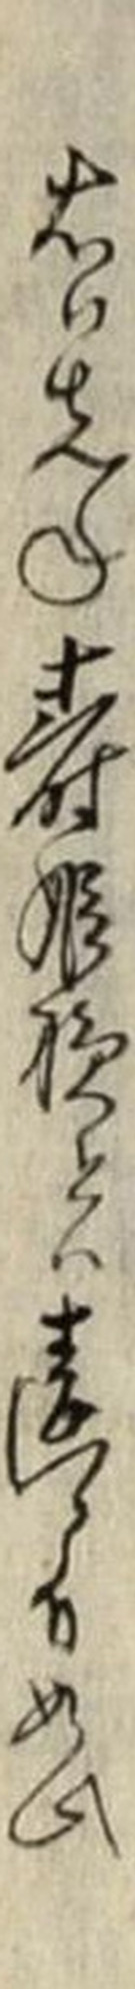右は先年寿姫様とは違候に付如此
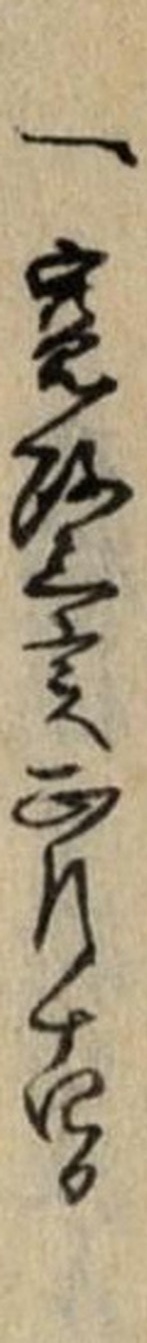一寛政三亥正月十四日
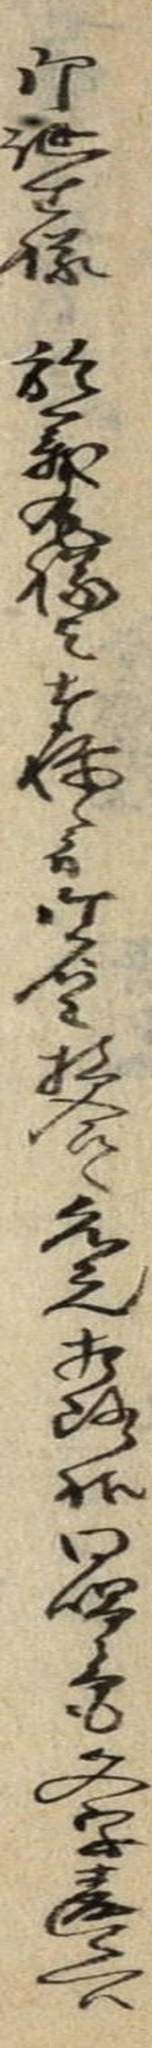御誕生様於義丸様と奉称候に付御名に指合候名元相改候様同唱に而も文字違候へは
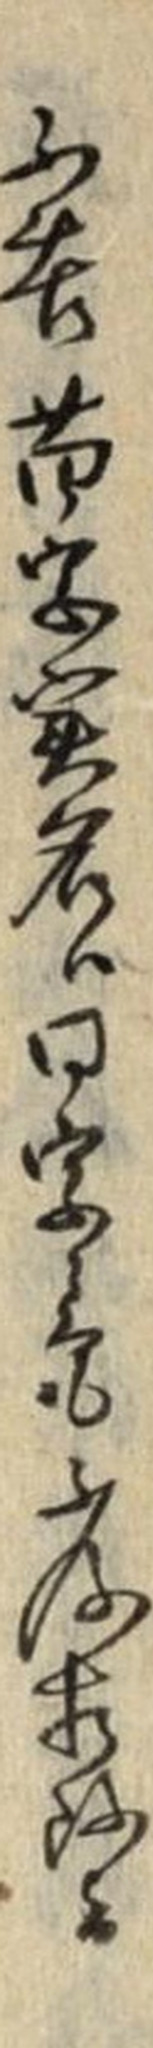不苦苗字実名は同字に而も不及相改旨
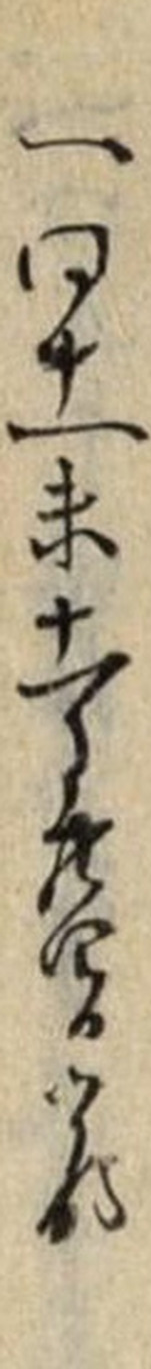一同十一未十一月廿四日御触
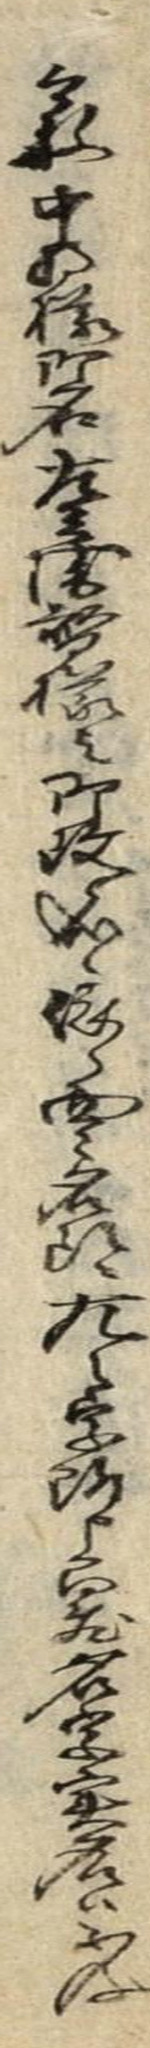今般中将様御名左兵衛督様と御改被成候依之面々名頭へ左之字附申間敷名字実名は不及
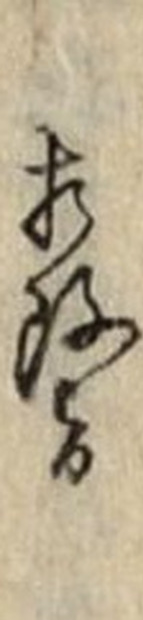相改旨
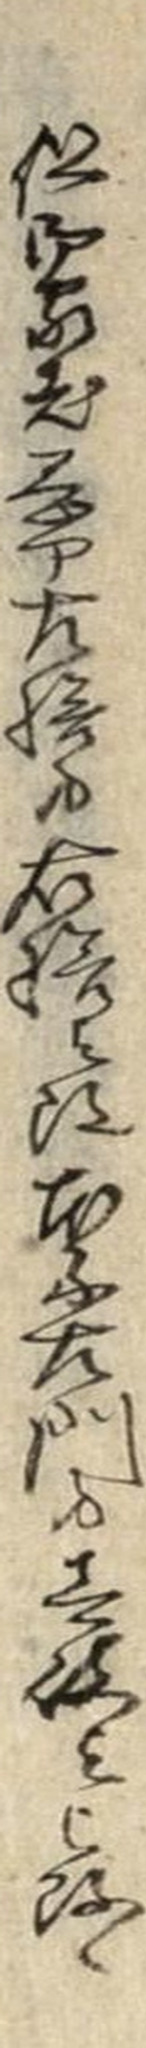但御家老岡部左膳方右膳と改本多左門方壱岐と被改候
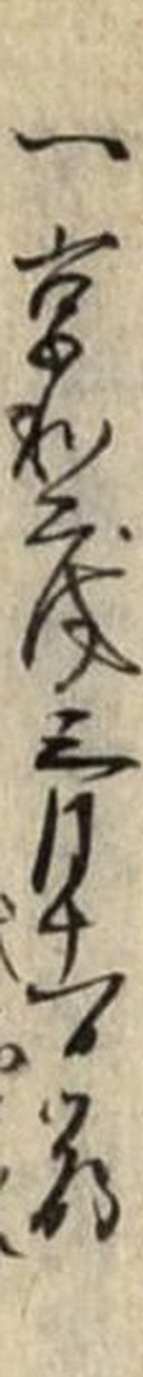一享和二戌三月十一日御触
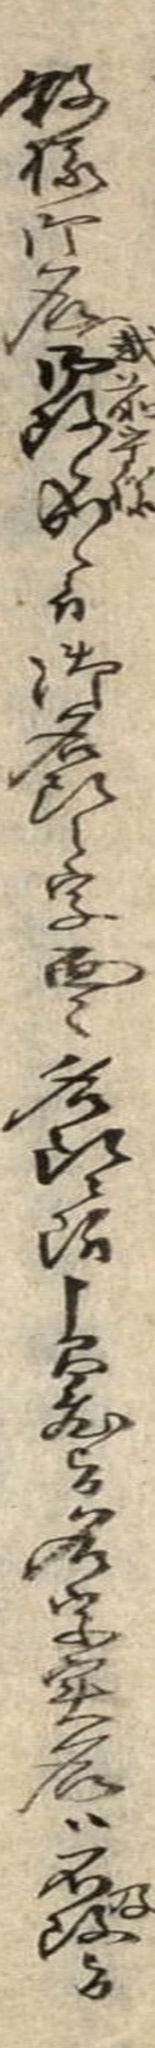殿様御名越前守様御改被成候に付御名頭之字面々名頭に附申間敷旨名字実名は不及改旨
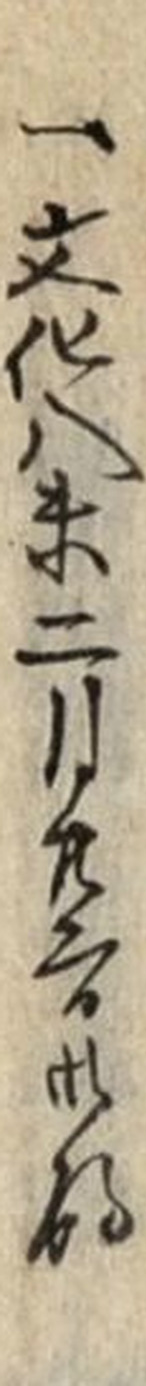一文化八未二月廿二日御触
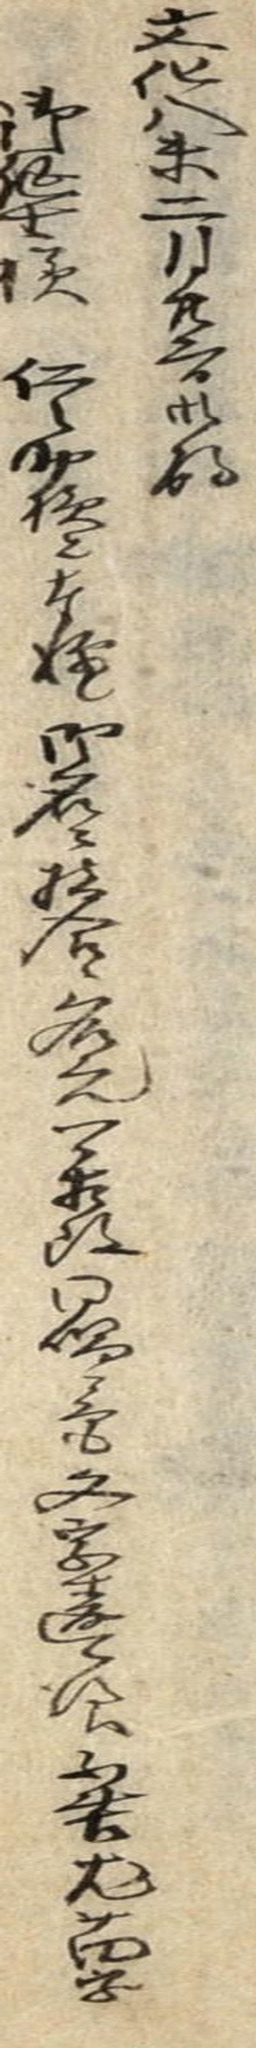御誕生様仁之助様と奉称候御名に指合候名元相改様同唱に而も文字違候へは不苦尤苗字
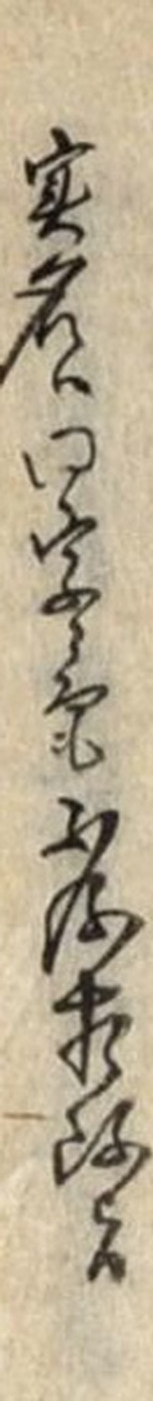実名は同字に而も不及相改旨
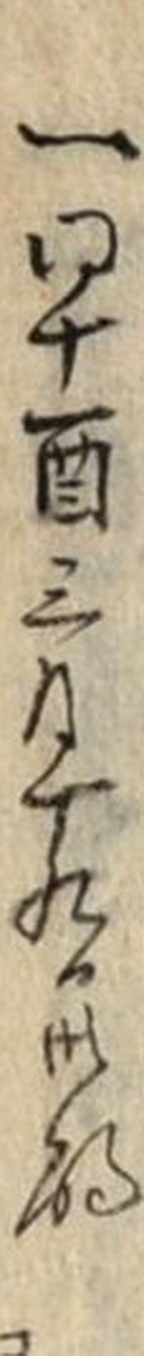一同十酉三月十九日御触
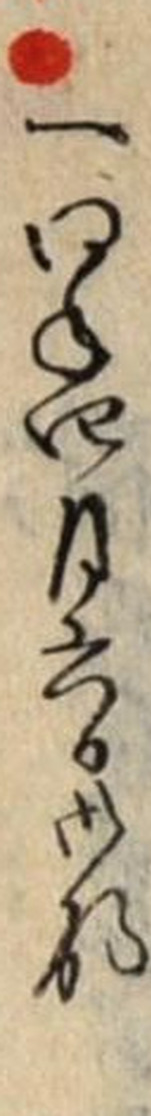一同年四月六日御触
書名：蒐輯之部
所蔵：福井県文書館 Fukui Prefectural Archives
